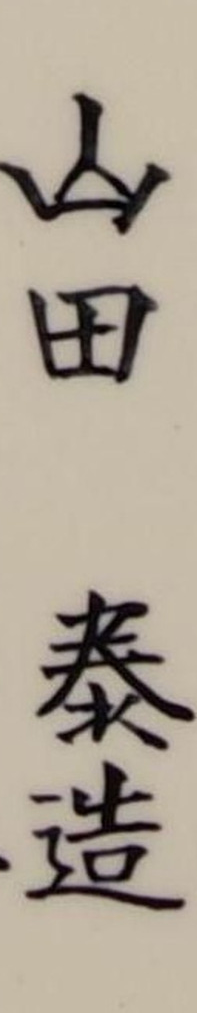山田泰造
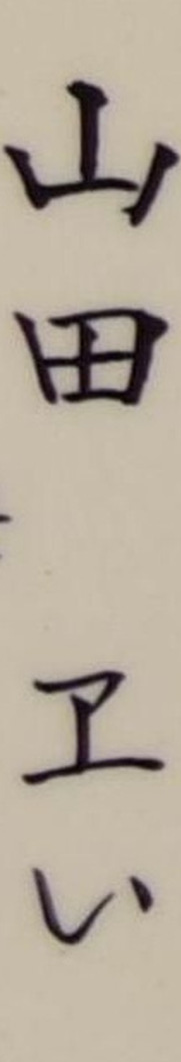山田えい
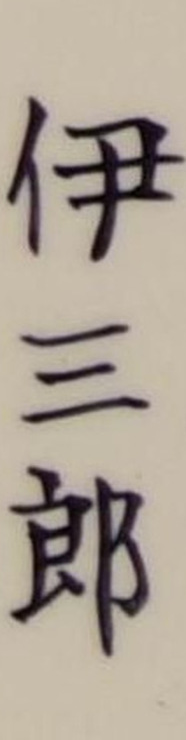伊三郎

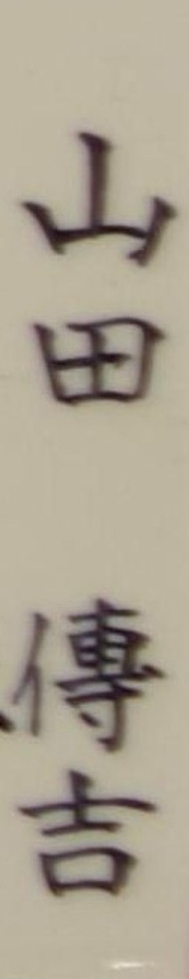山田傳吉
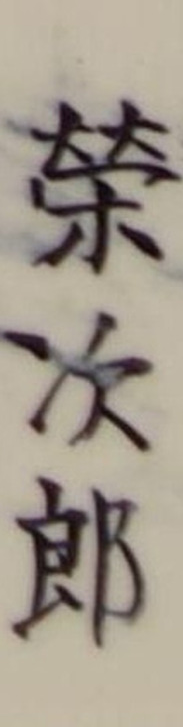榮次郎
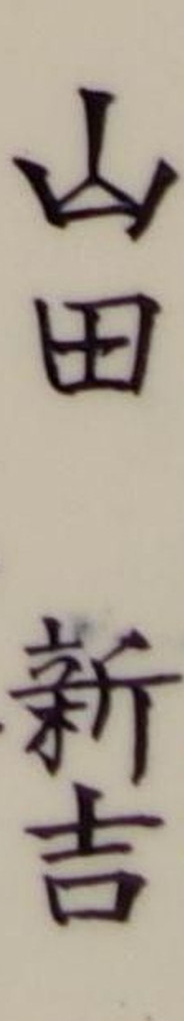山田新吉
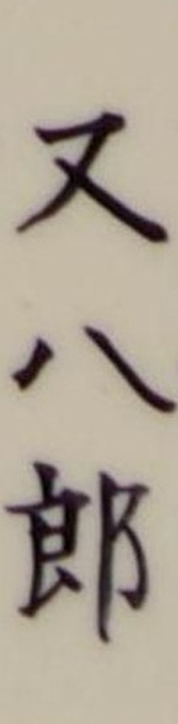又八郎
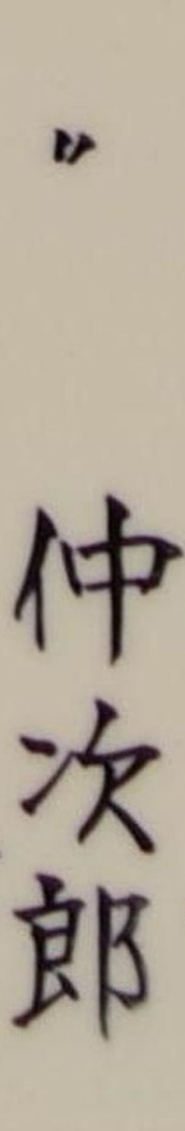仲次郎
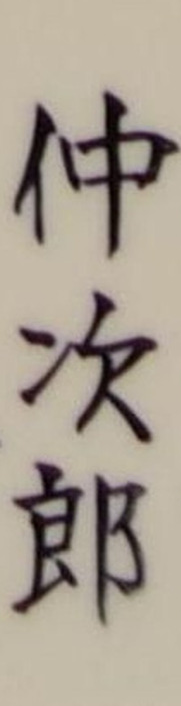仲次郎
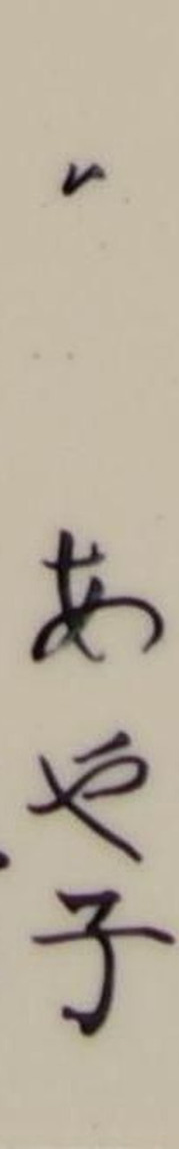あや子
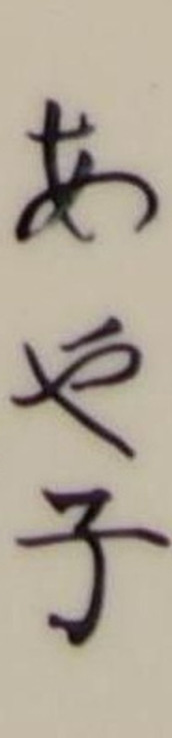あや子
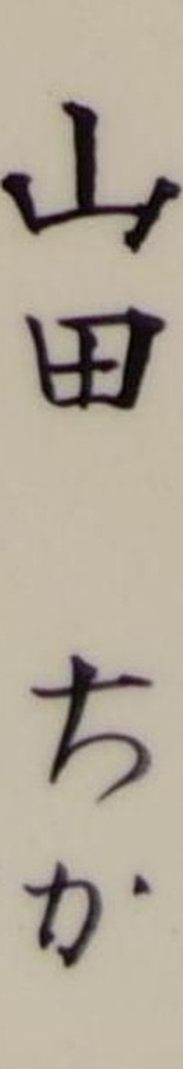山田ちか
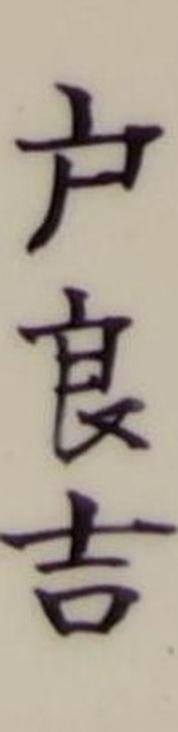戸良吉
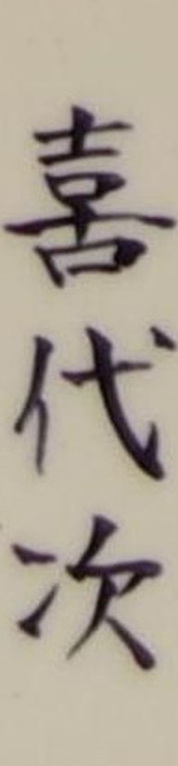喜代次
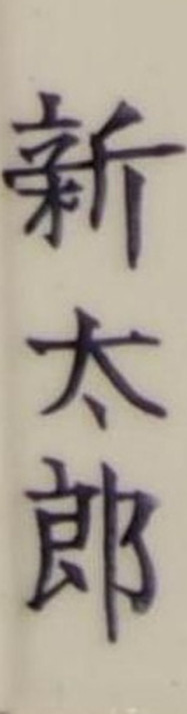新太郎

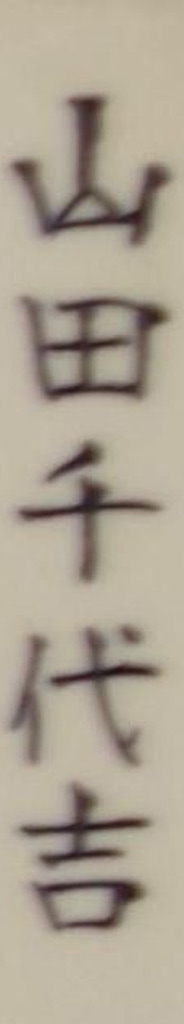山田千代吉
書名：M~S
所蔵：高野山金剛峯寺
